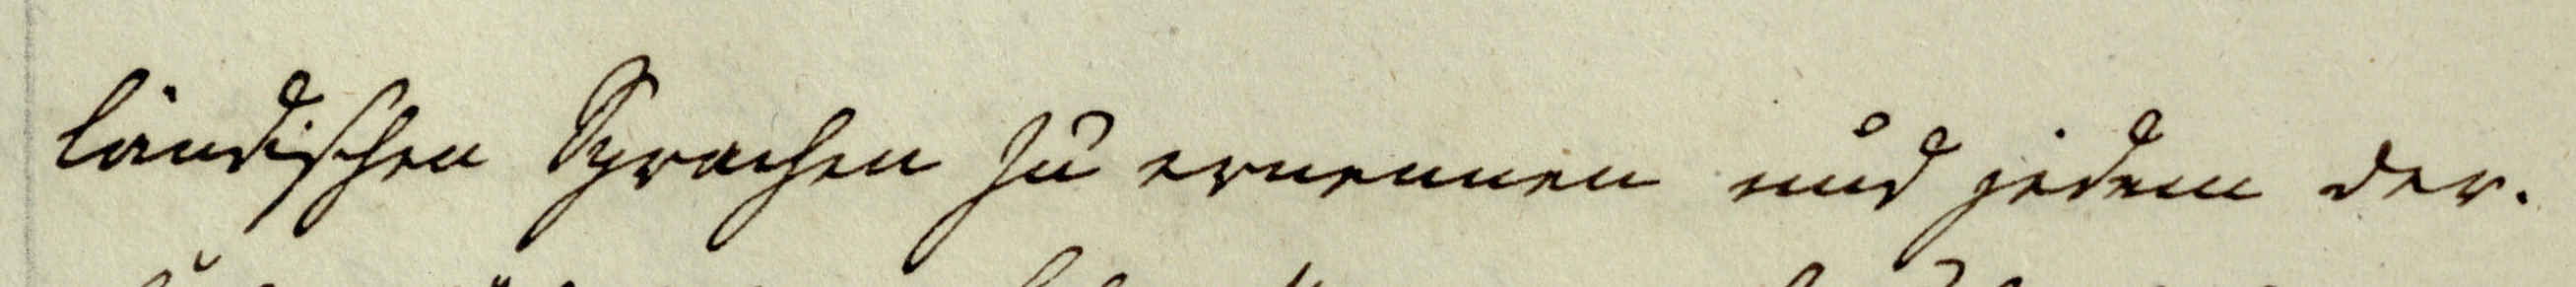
ländischen Sprachen zu ernennen und jedem der¬
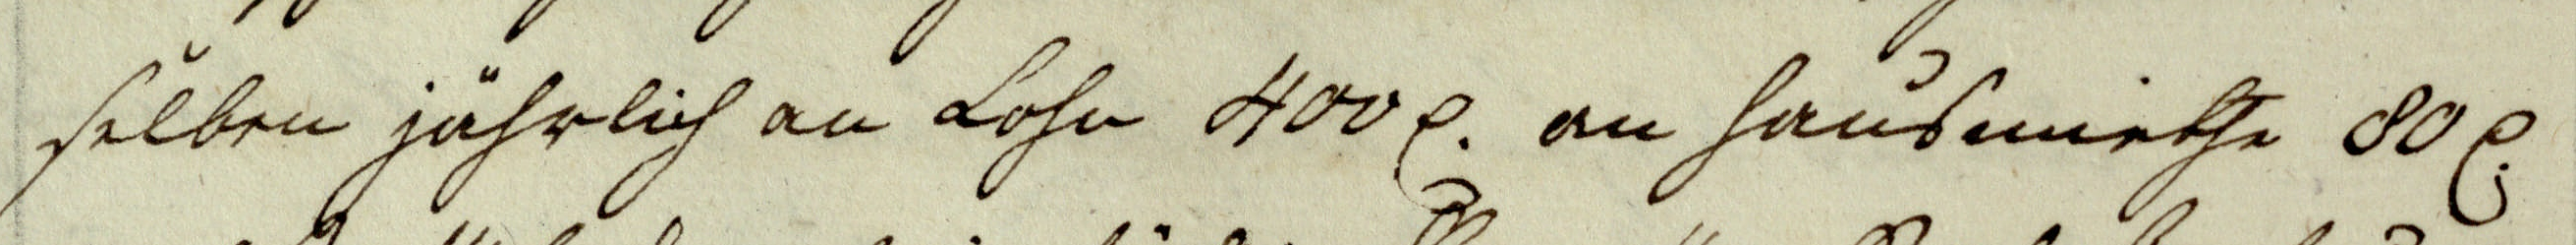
selben jährlich an Lohn 400 ler. an Hausmiethe 80 l.
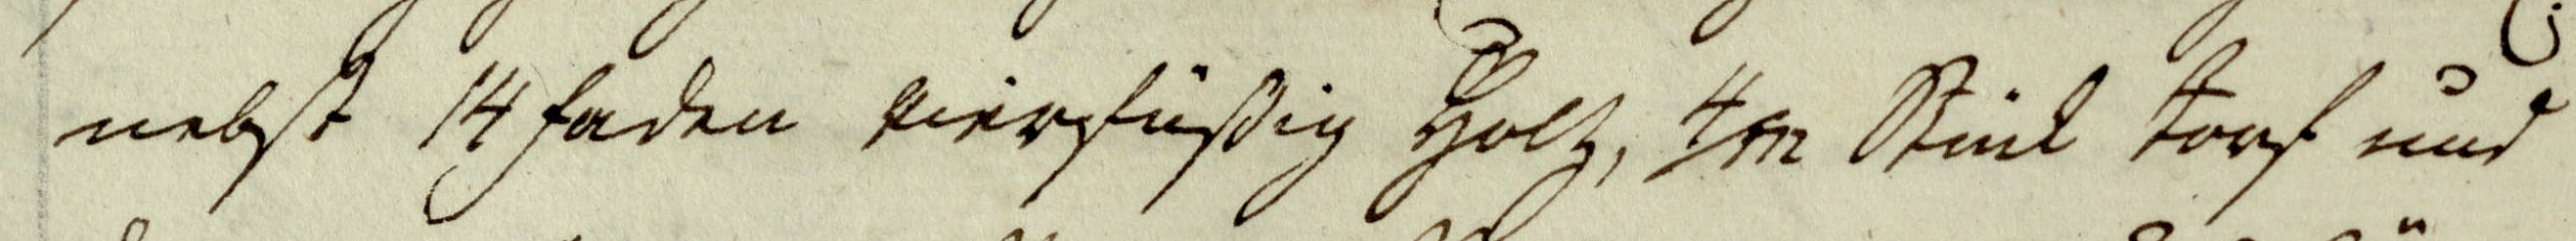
nebst 14 Faden vierfüßig Holz, 4/m Stück Torf und
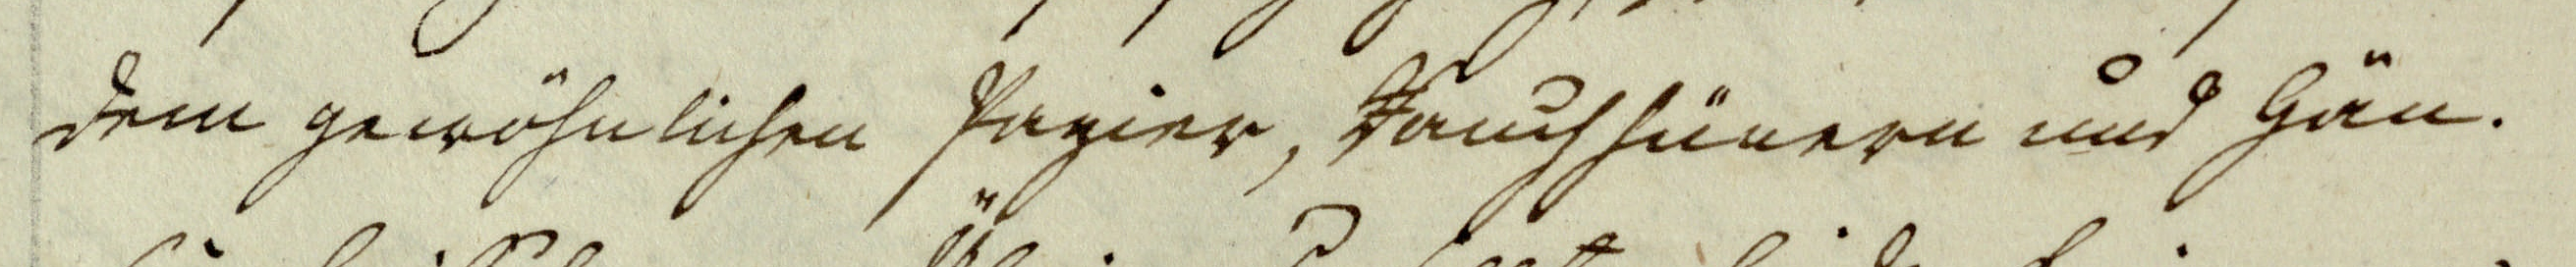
dem gewöhnlichen Papier, Rauchhünern und Gän¬
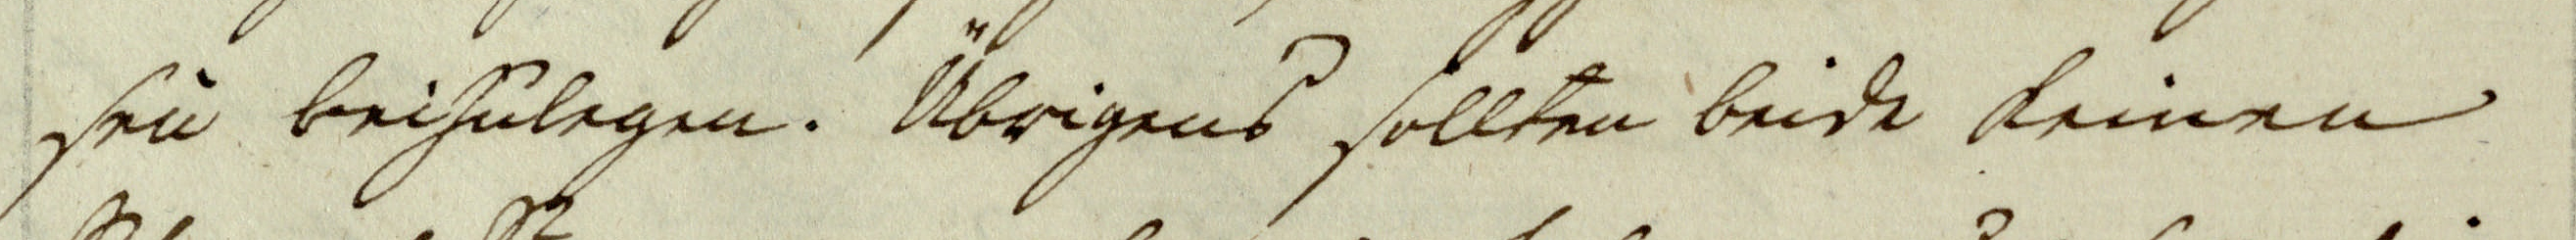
sen beizulegen. Übrigens sollten beide keinen
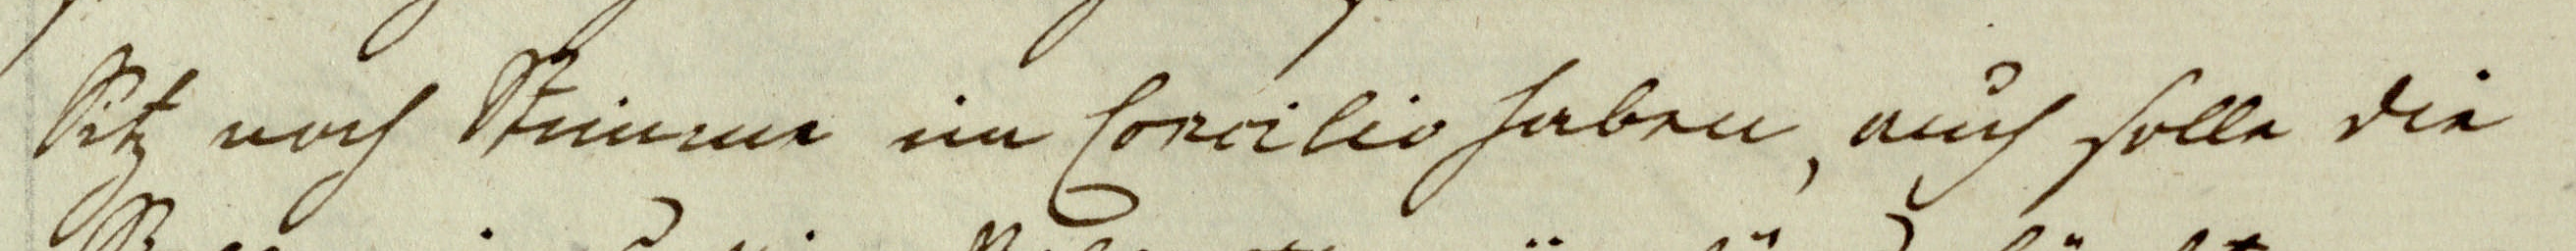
Sitz noch Stimme im Concilio haben, auch solle die
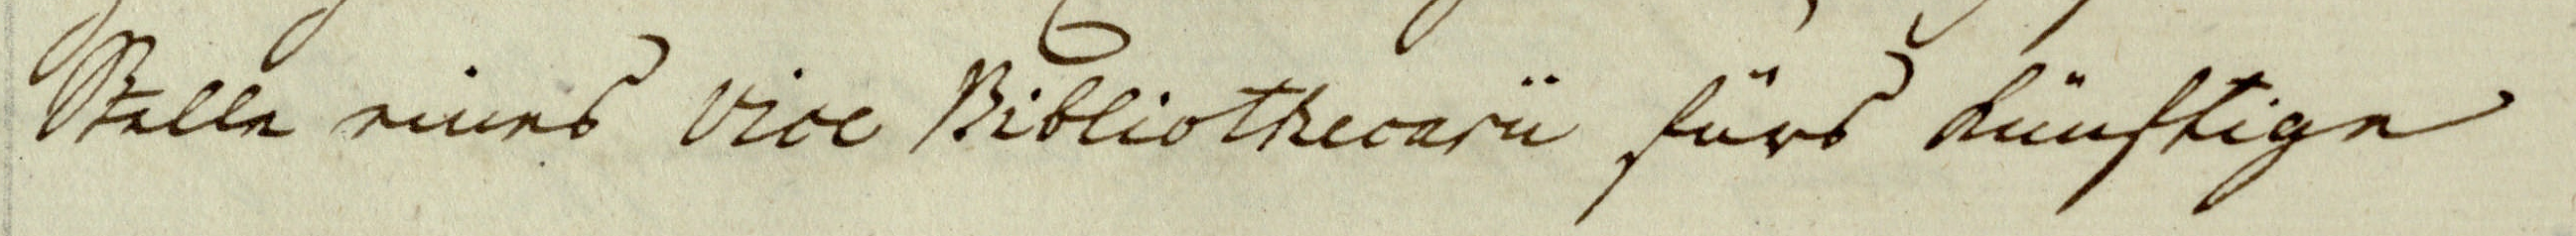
Stelle eines Vice Bibliothecarii fürs künftige
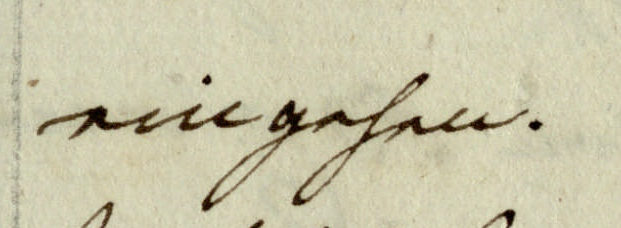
eingehen.
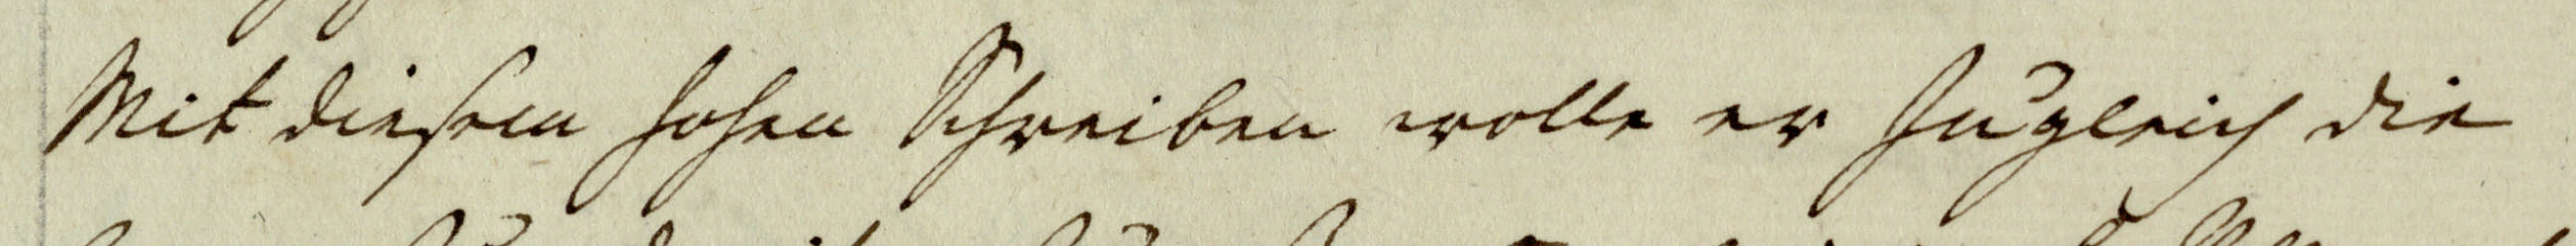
Mit diesem hohen Schreiben wolle er zugleich die
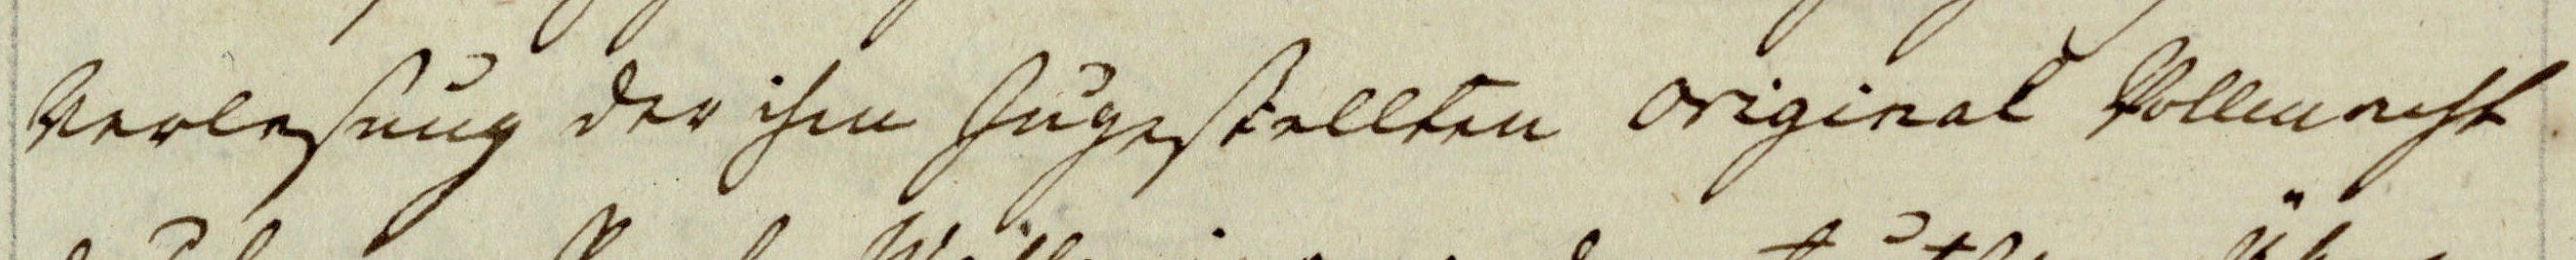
Vorlesung der ihm zugestellten Original Vollmacht
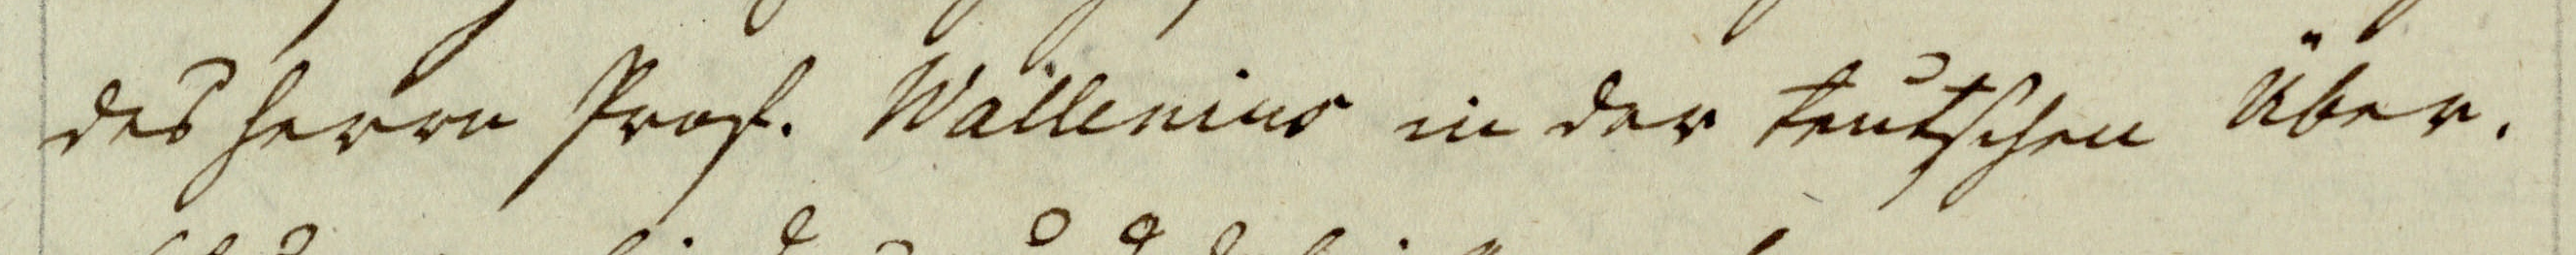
des Herrn Prof. Wallenius in der teutschen Über¬
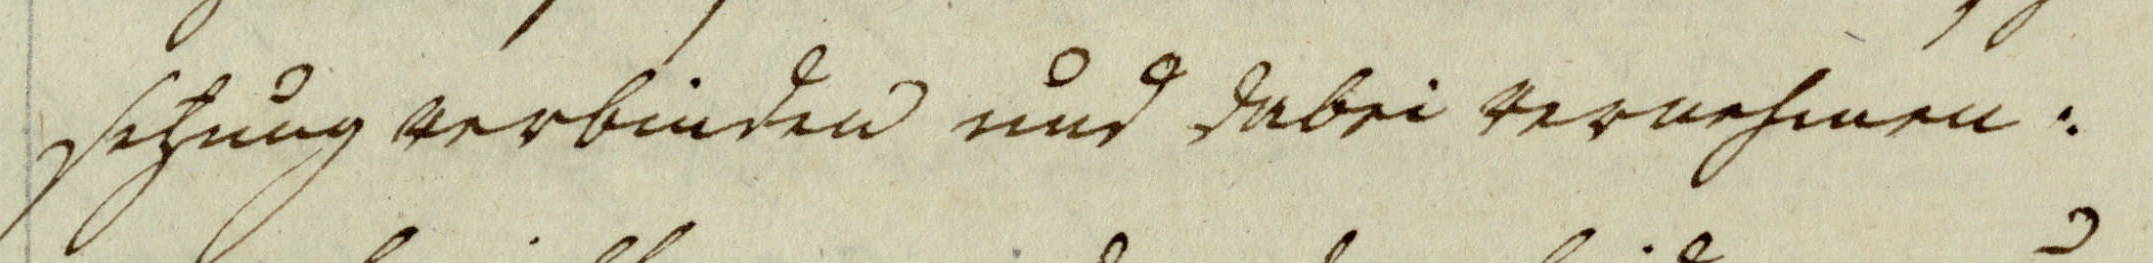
setzung verbinden und dabei vernehmen:
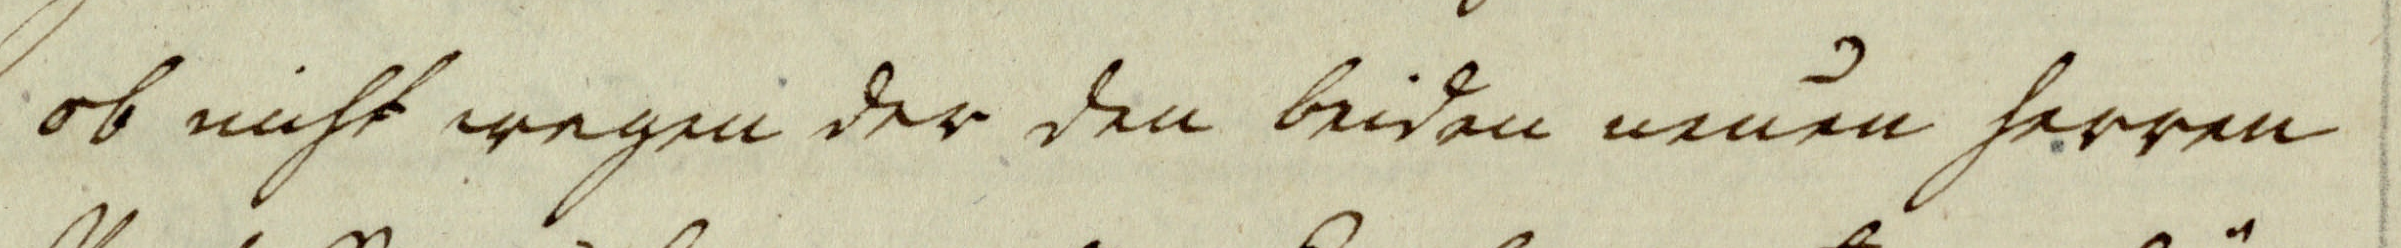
ob nicht wegen der den beiden neuen Herren
